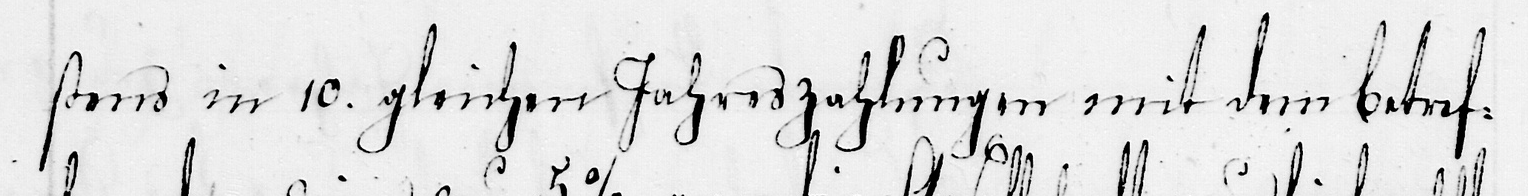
stens in 10. gleichen Jahreszahlungen mit dem betref¬
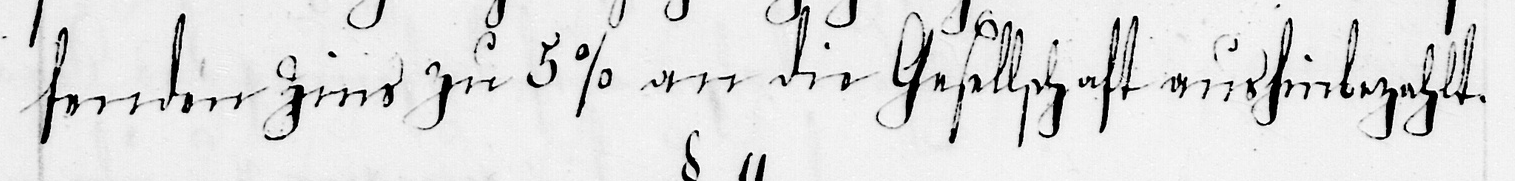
fenden Zins zu 5% an die Gesellschaft aushinbezahlt.
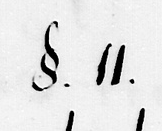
§. 11.
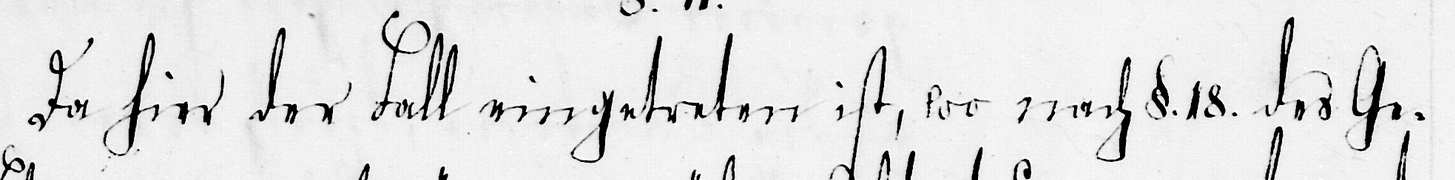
Da hier der Fall eingetreten ist, wo nach §. 18. des Ge¬
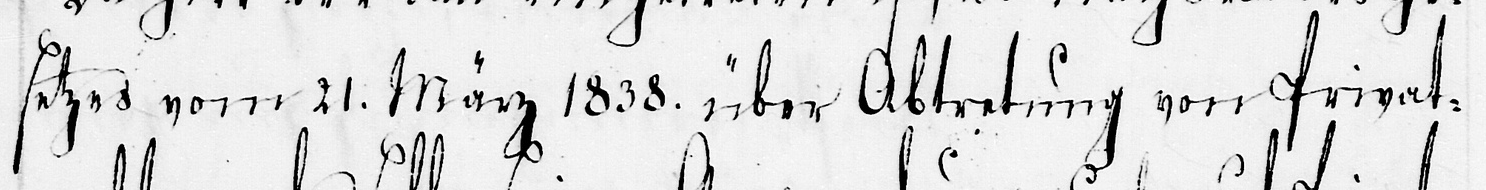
setzes vom 21. März 1838. über Abtretung von Privat¬
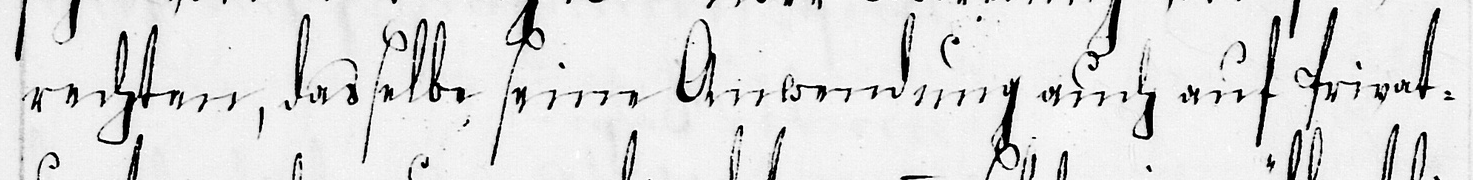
rechten, dasselbe seine Anwendung auch auf Privat¬
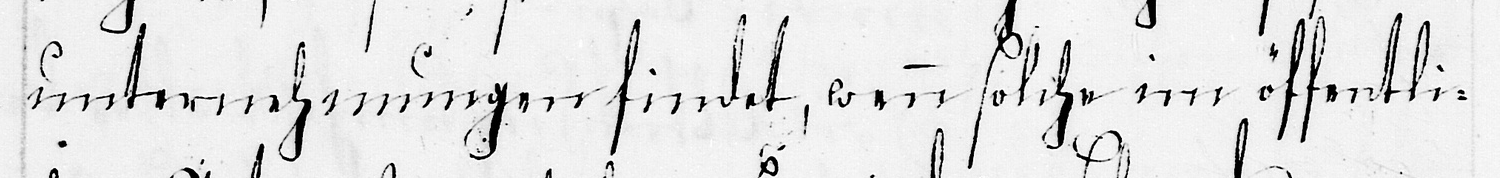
unternehmungen findet, wenn solche im öffentli¬
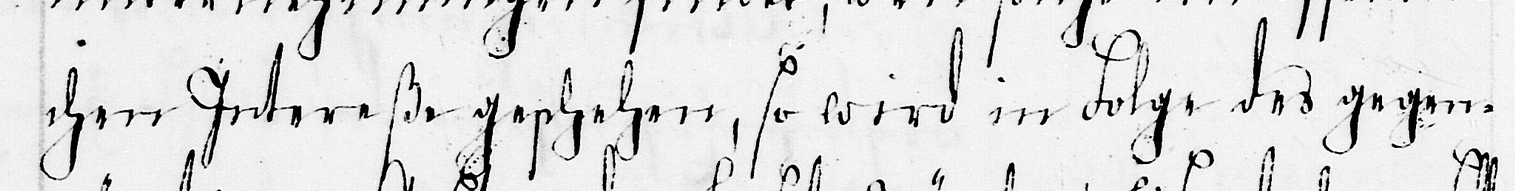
chen Intereße geschehen, so wird in Folge des gegen¬
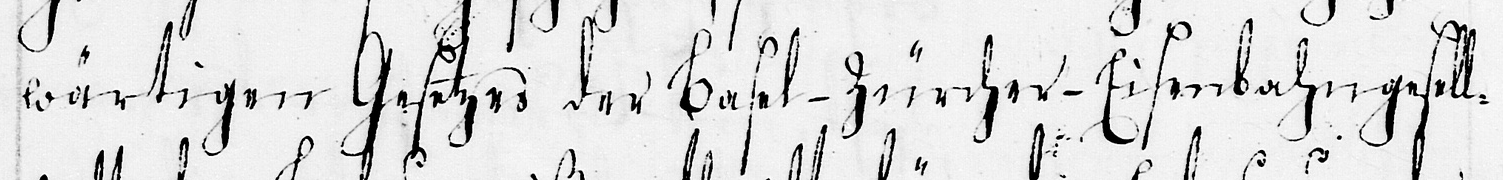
wärtigen Gesetzes der Basel-Zürcher-Eisenbahngesel¬
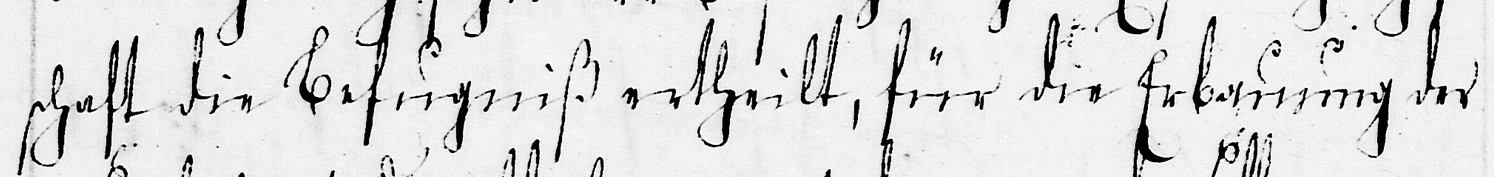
schaft die Befugniß ertheilt, für die Erbauung der
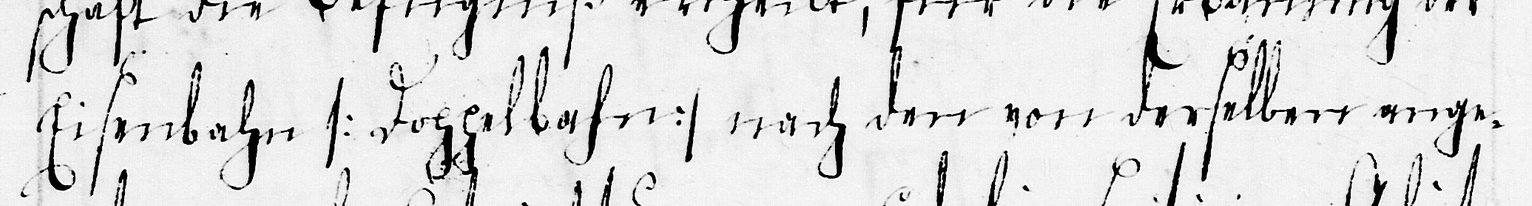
Eisenbahn [Doppelbahn] nach den von derselben ange¬
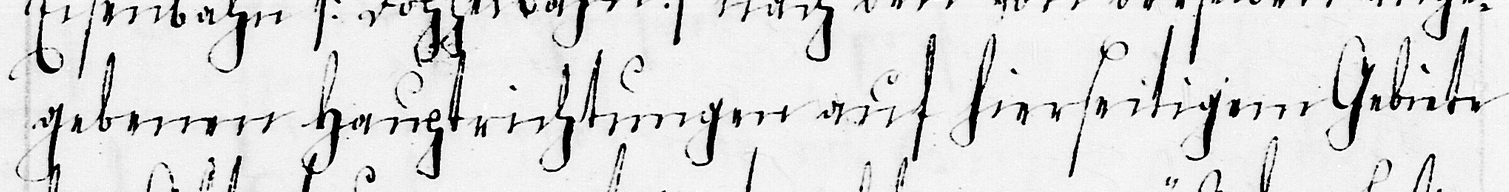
gebenen Hauptrichtungen auf hierseitigem Gebiete
